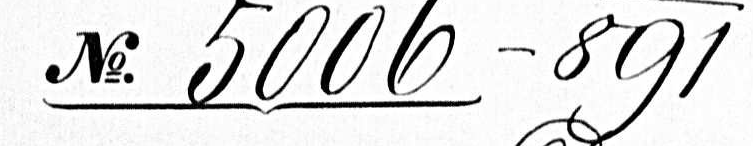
No. 5006 - 1891
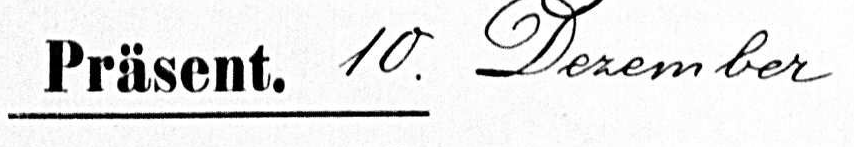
Präsent. 10. Dezember
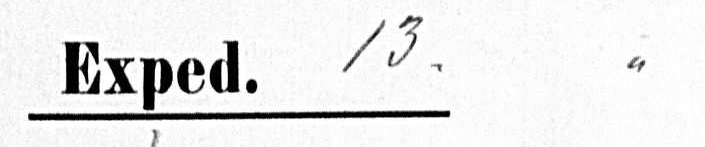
Exped. 13. „
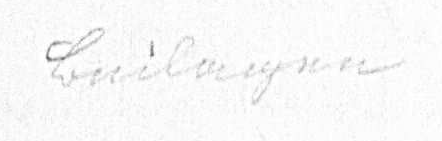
Beilagen
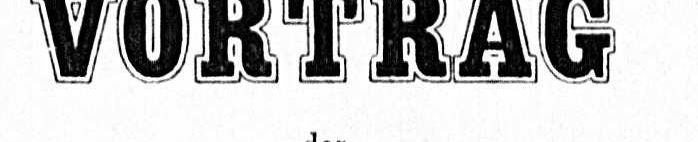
VORTRAG
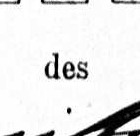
des
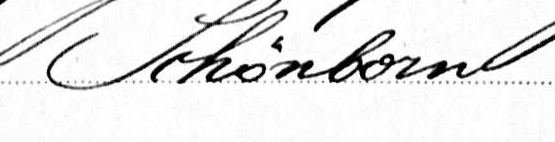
Schönborn
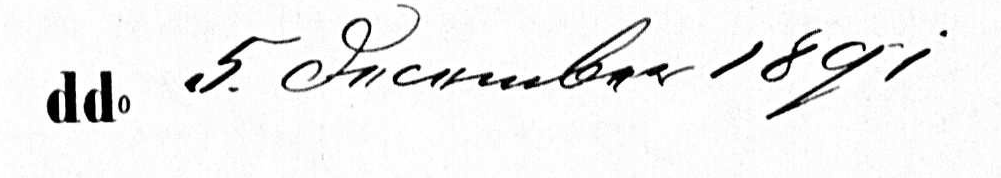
ddo 5. December 1891
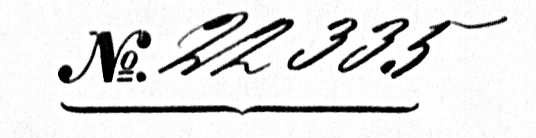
No. 22335
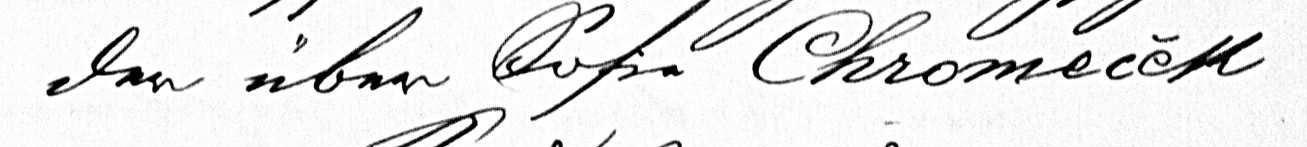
der über Sofia Chromeček
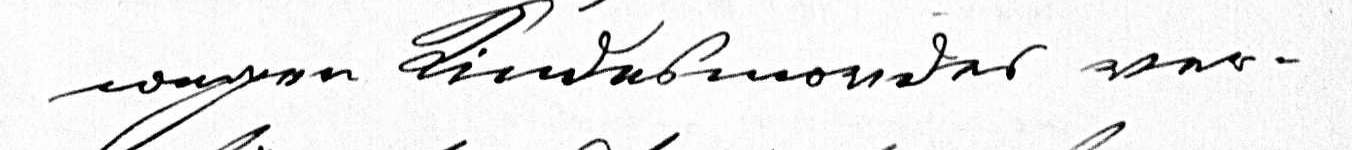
wegen Kindesmordes ver¬
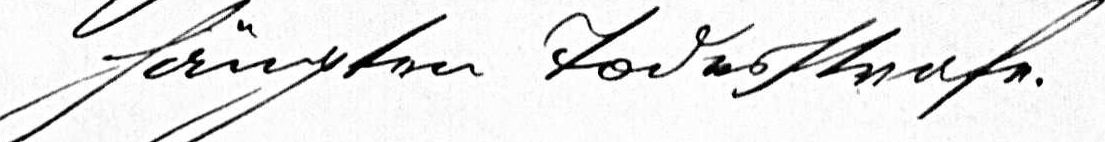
hängten Todesstrafe.
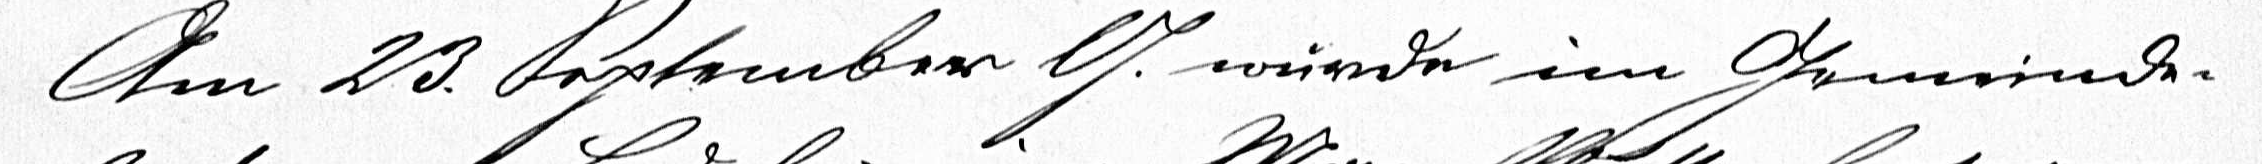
Am 23. September lJ würde im Gemeinde¬
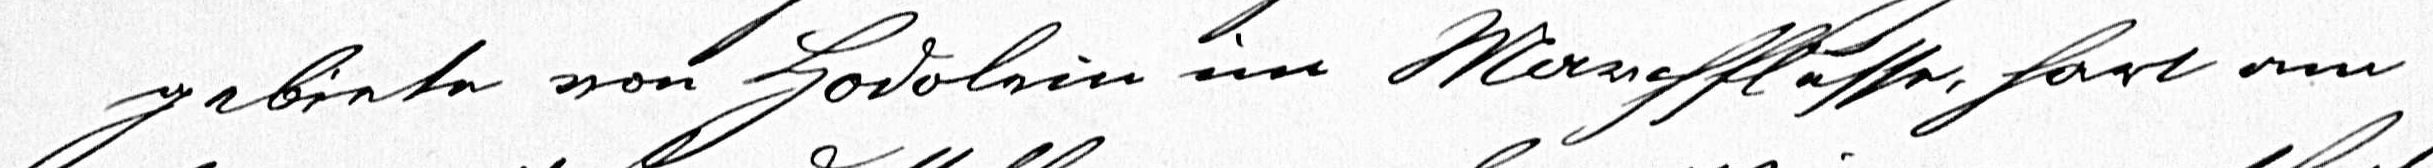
gebiete von Hodolein im Marchflusse, hart am
